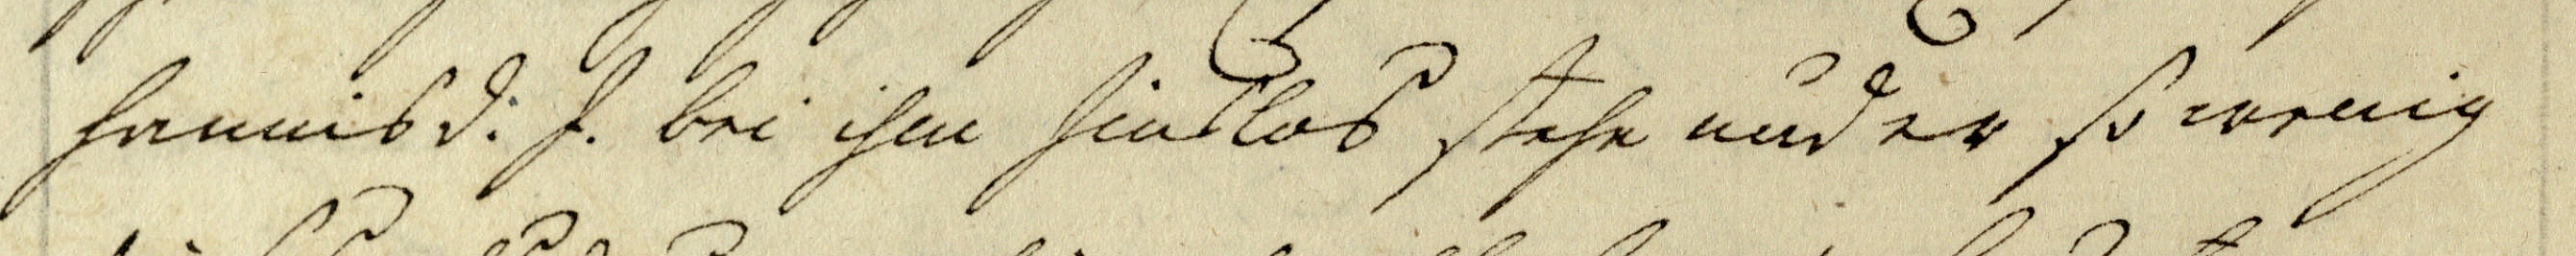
hannis d. J. bei ihm zinslos stehe und er so wenig
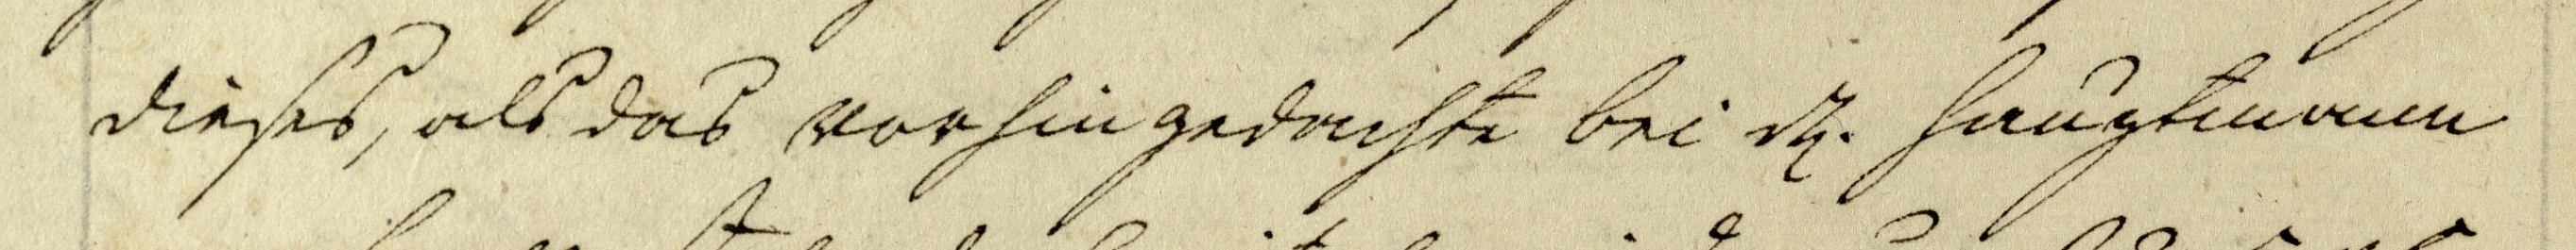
dieses, als das vorhingedachte bei dh. Hauptmann
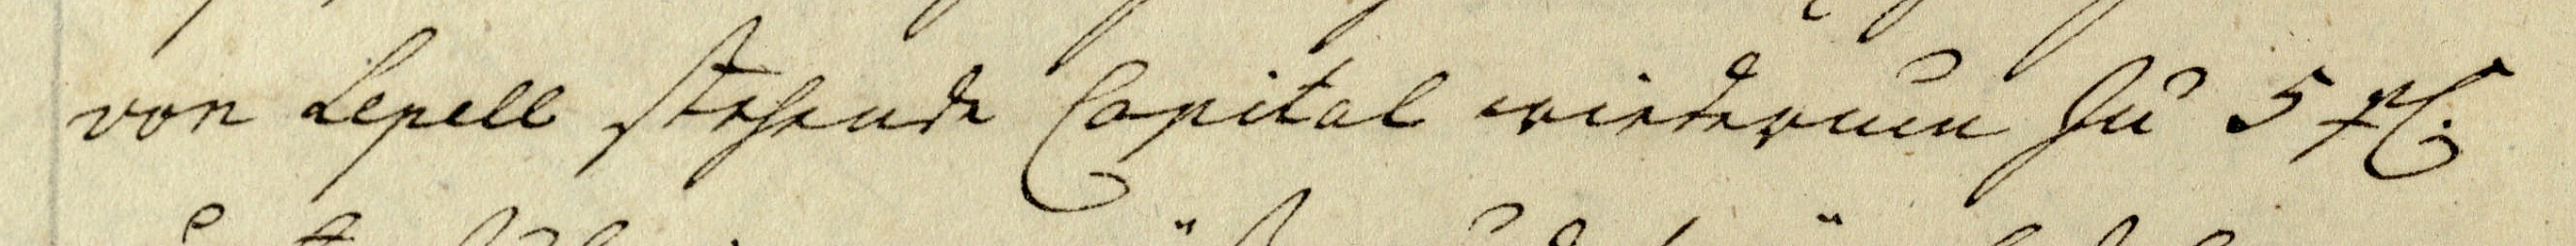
von Lepell stehende Capital wiederum zu 5 pl.
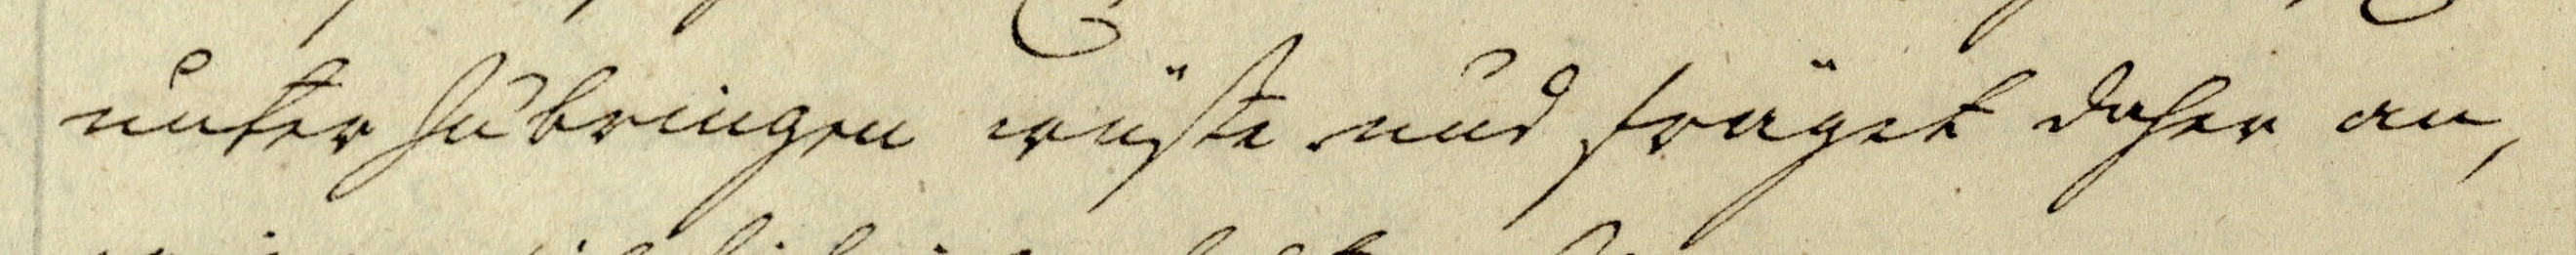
unter zubringen wüßte und fräget daher an,
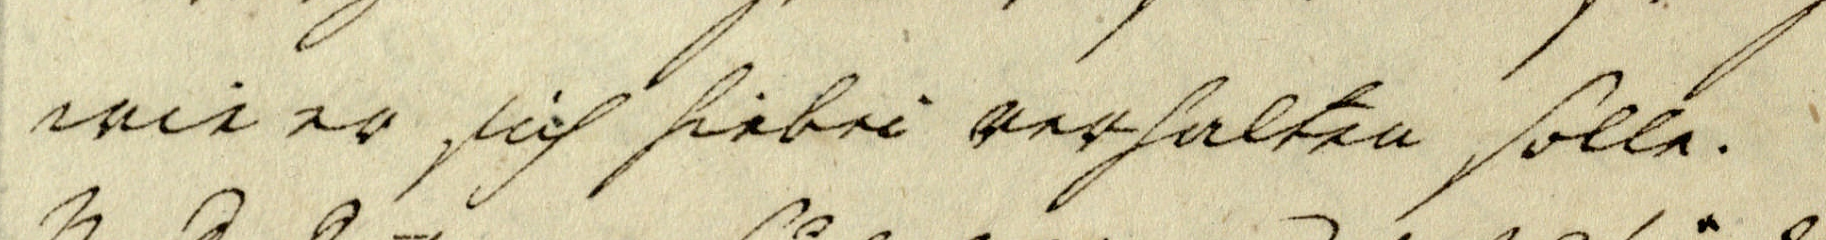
wie er sich hiebei verhalten solle.
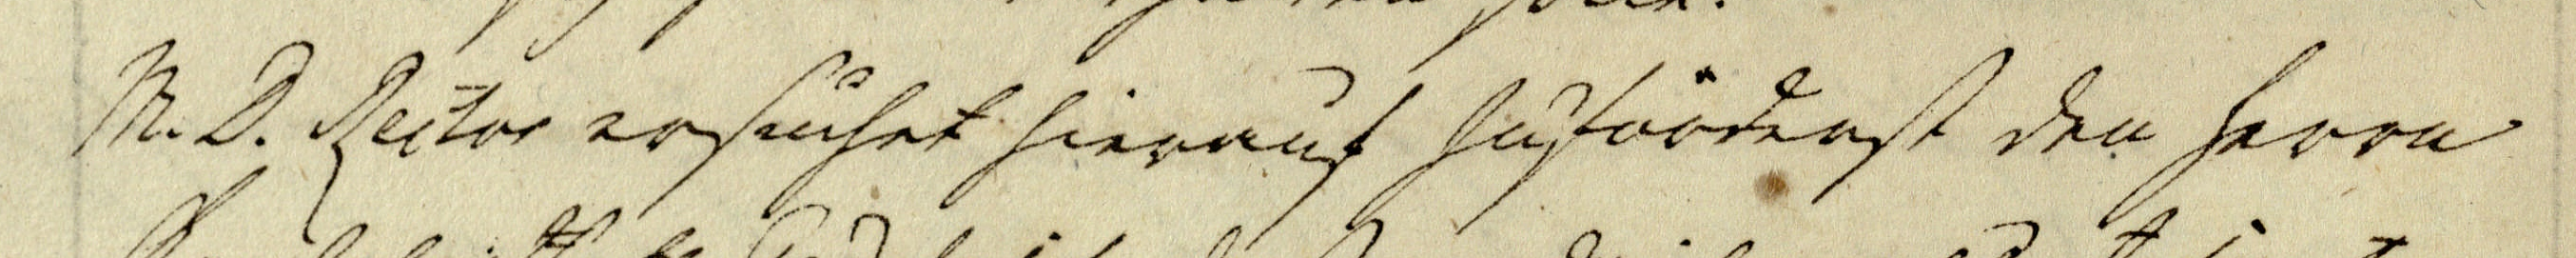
M. D. Rector ersuchet hierauf zuförderst den Herrn
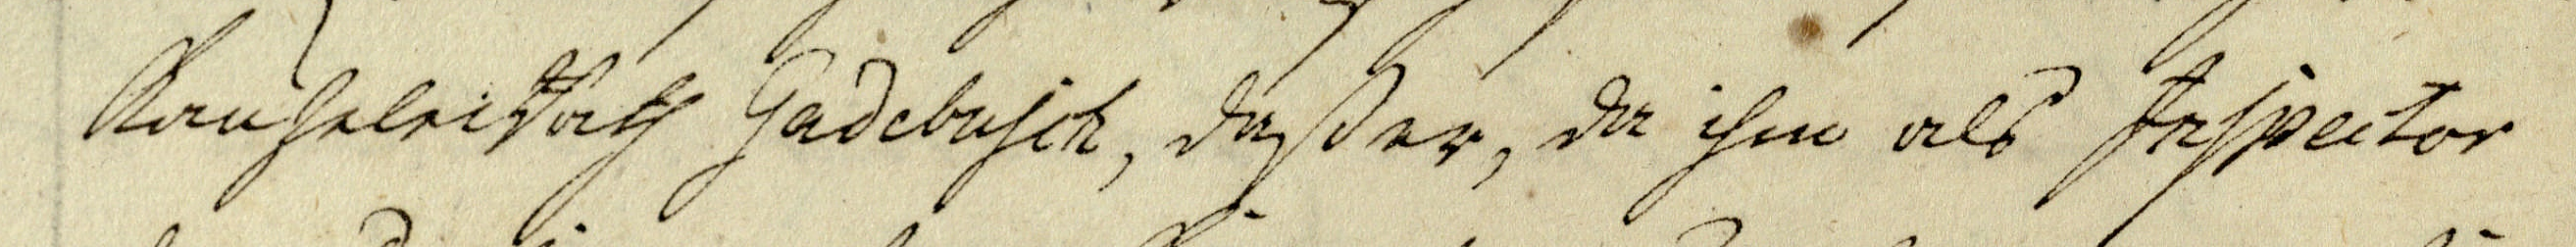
KanzeleiRath Gadebusch, daß er, da ihm als Inspector
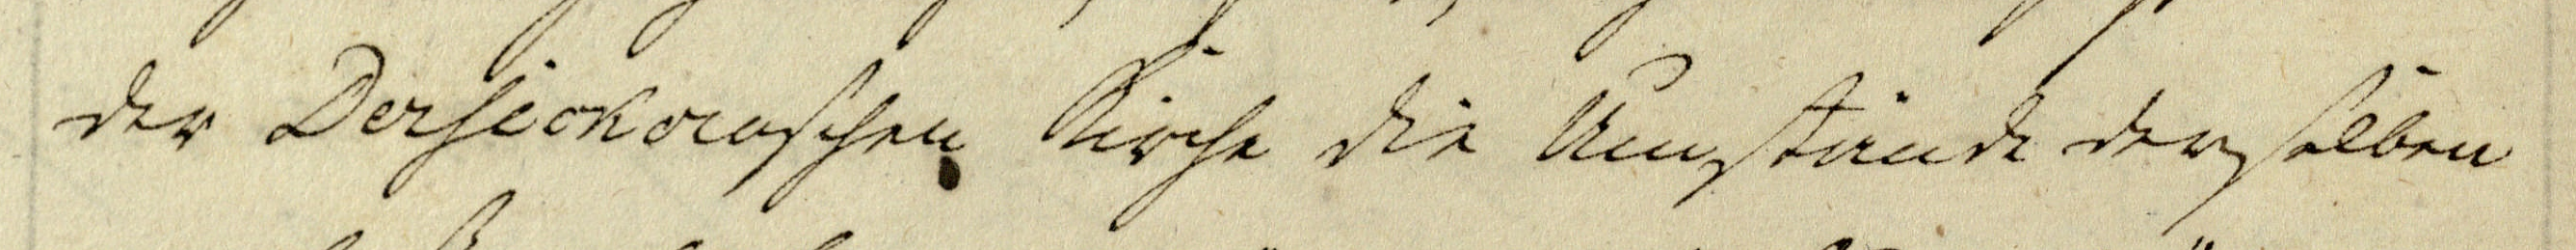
der Derseckowschen Kirche die Umstände derselben
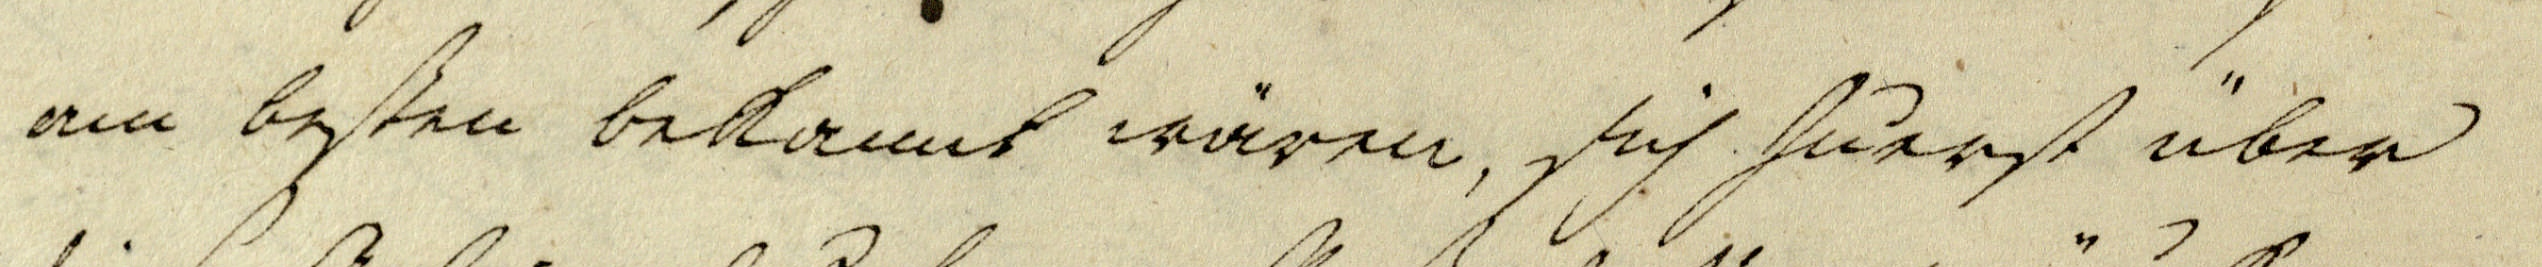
am besten bekannt wären, sich zuerst über
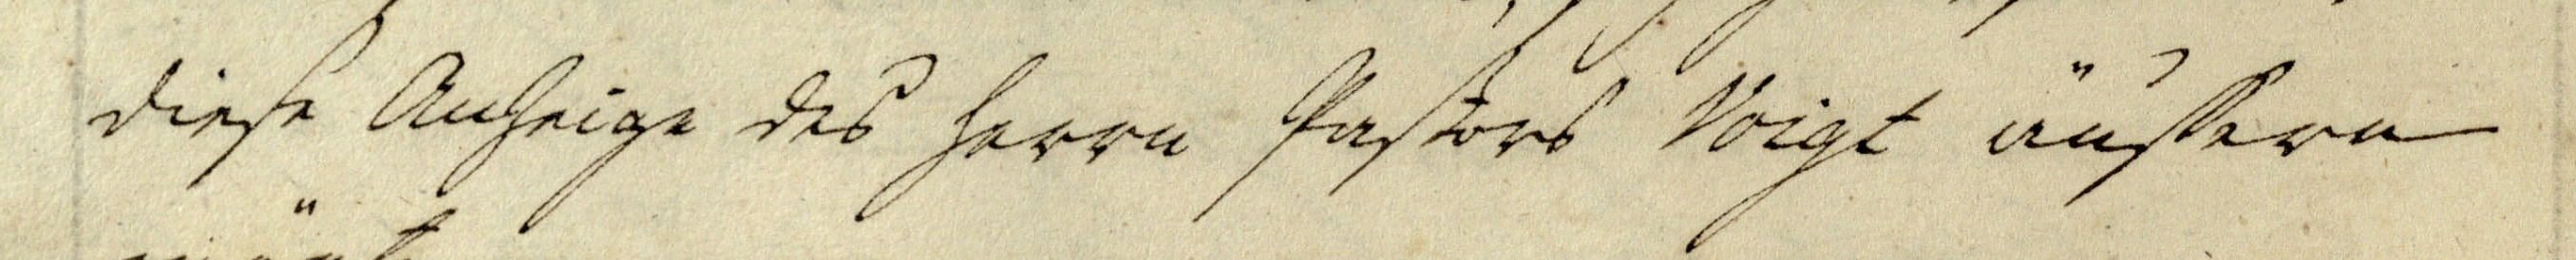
diese Anzeige des Herrn Pastors Voigt äussern
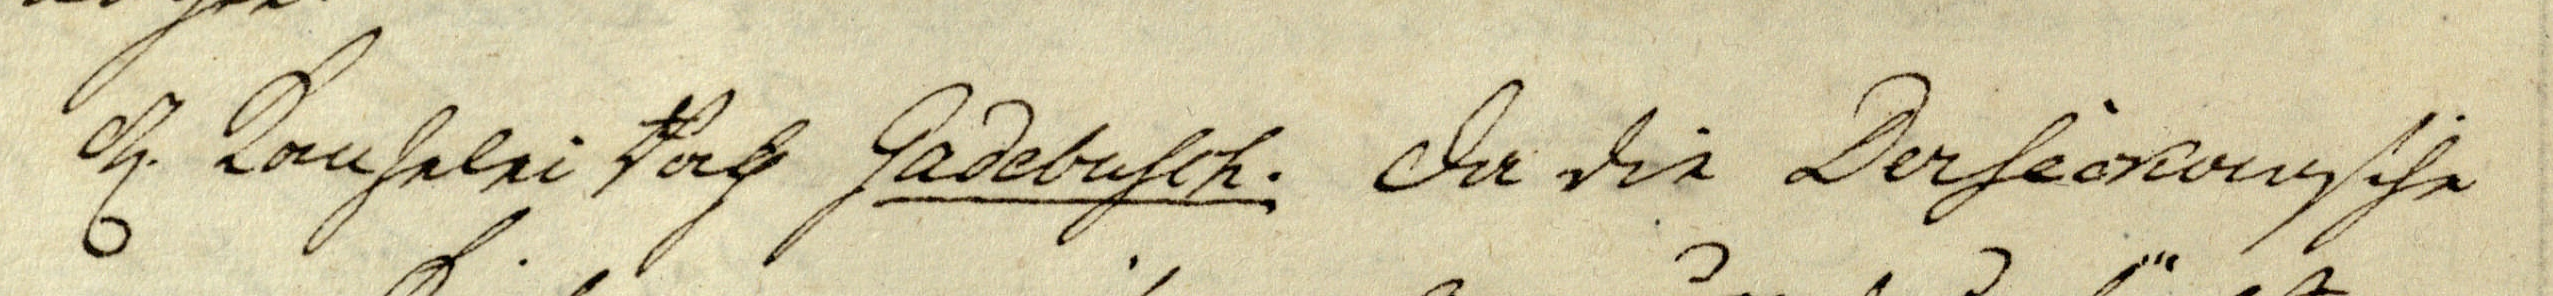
dh. Kanzelei Rath Gadebusch. Da die Derseckowsche
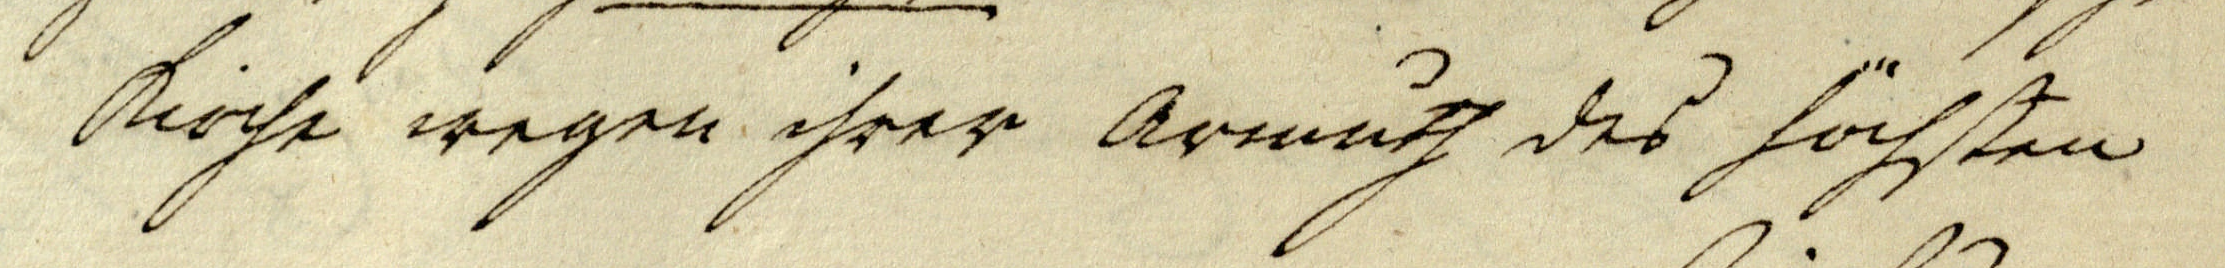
Kirche wegen ihrer Armuth des höchsten
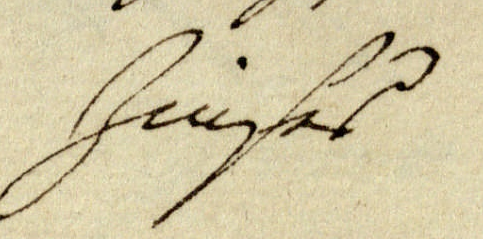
Zinses
